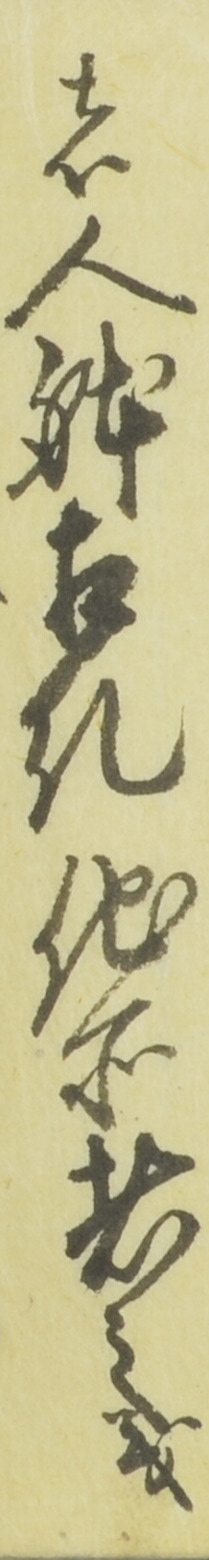は人体相糺他所者之義
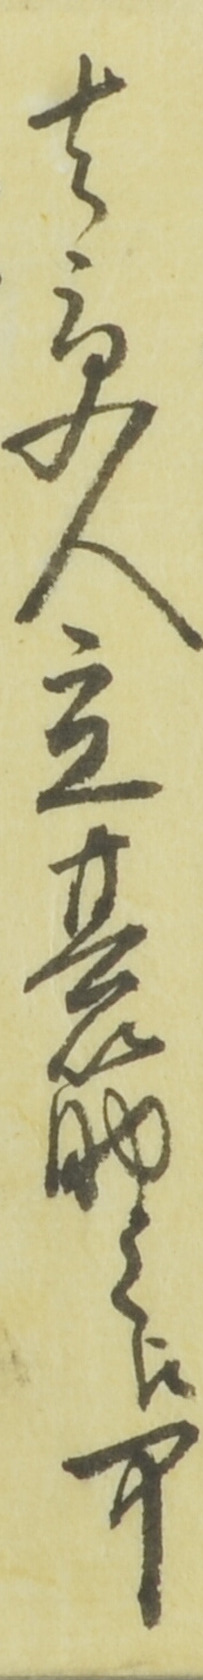は受人立其筋之江可
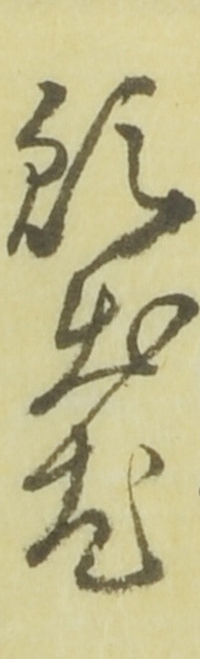願出尤
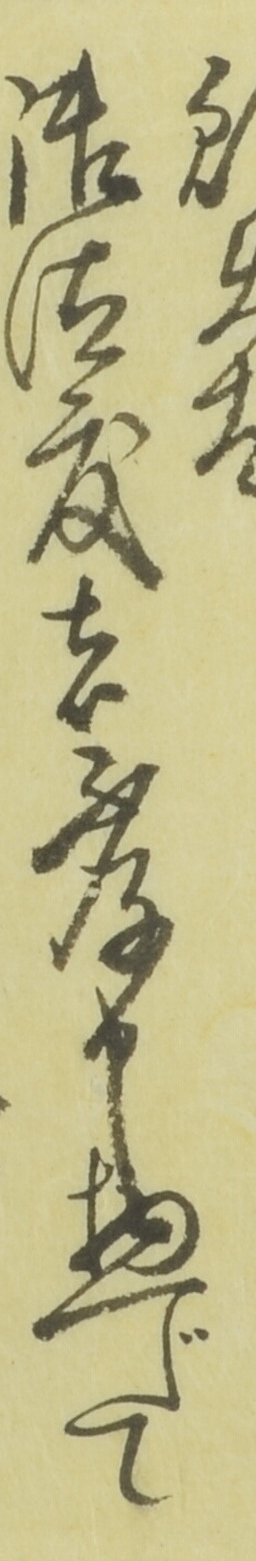御法度は不及申惣じて
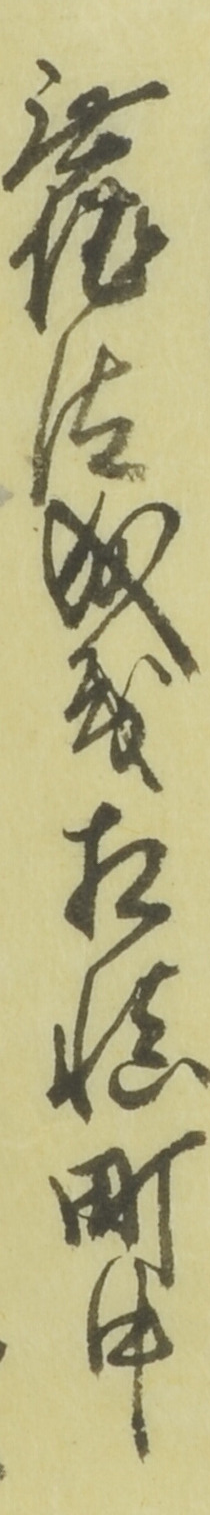無沙汰成義相慎町中
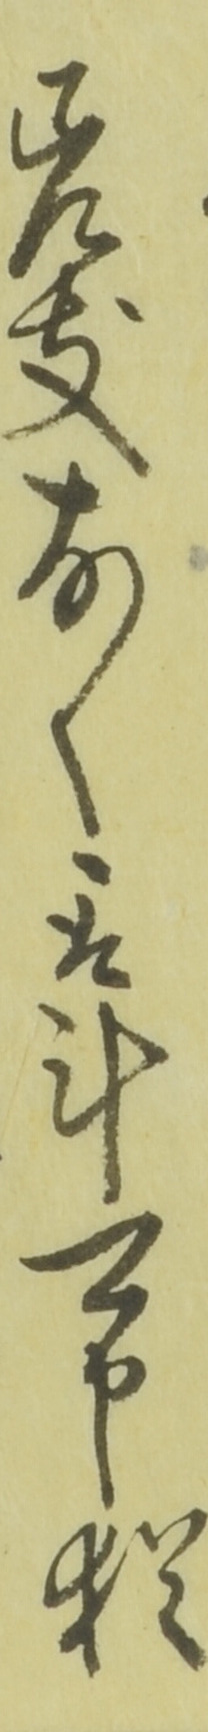差支なく取計可申猶
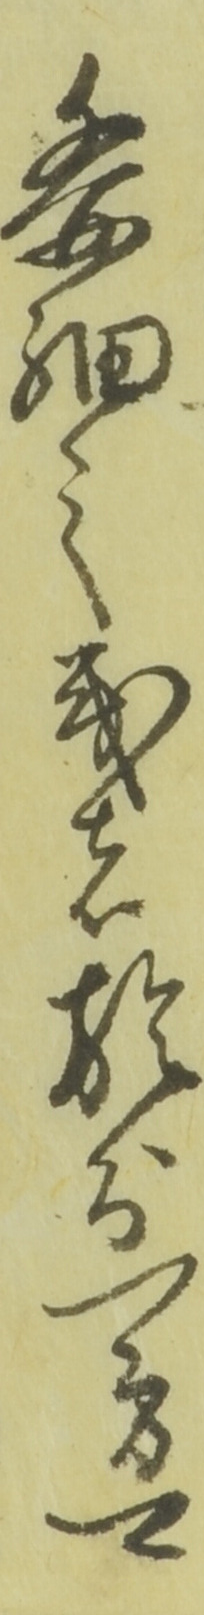委細之義は於分一方可
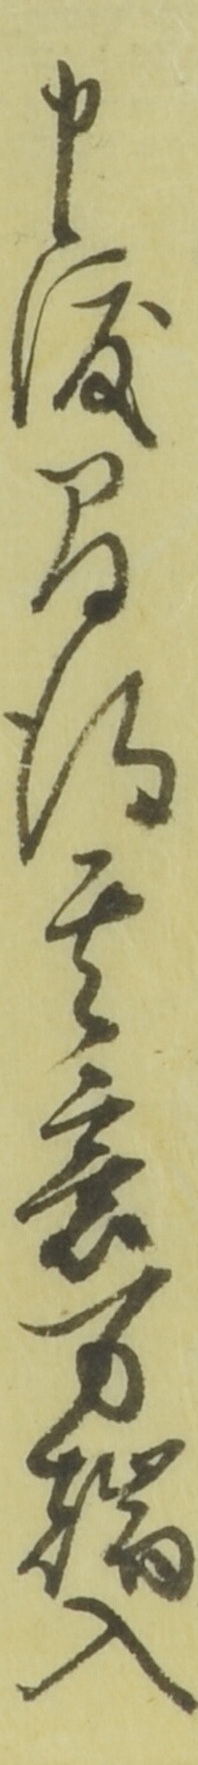申渡間得其意万端入
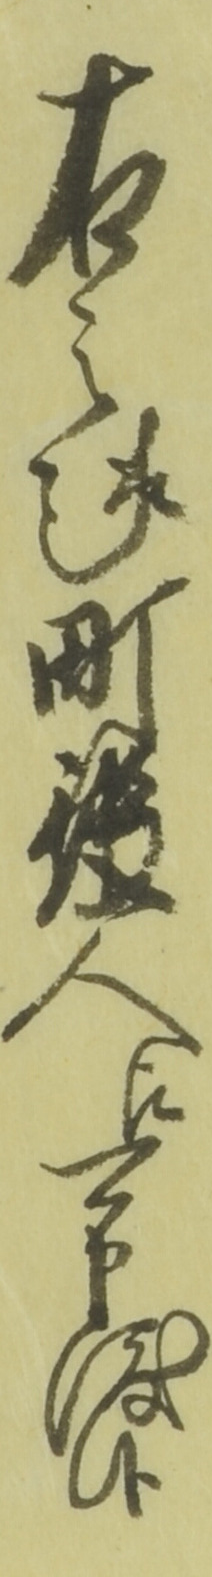右之趣町役人江可申渡候
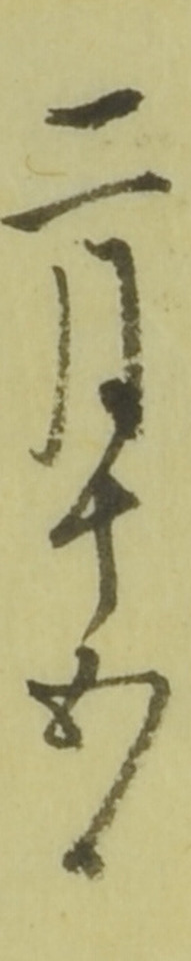二月十五日
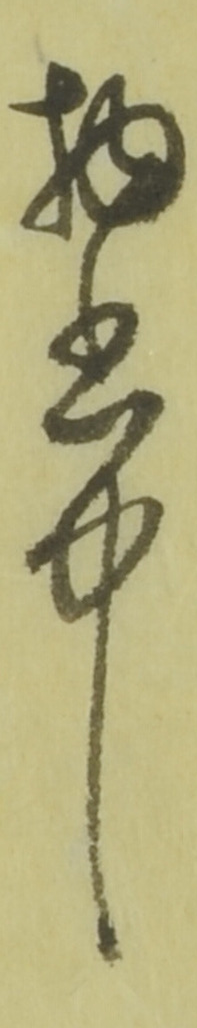物書中

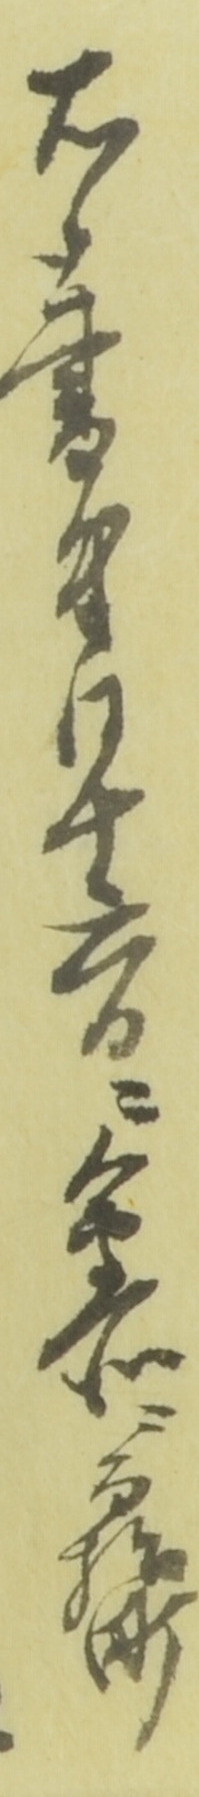右御書付同十六日ニ会所ニ而拾町
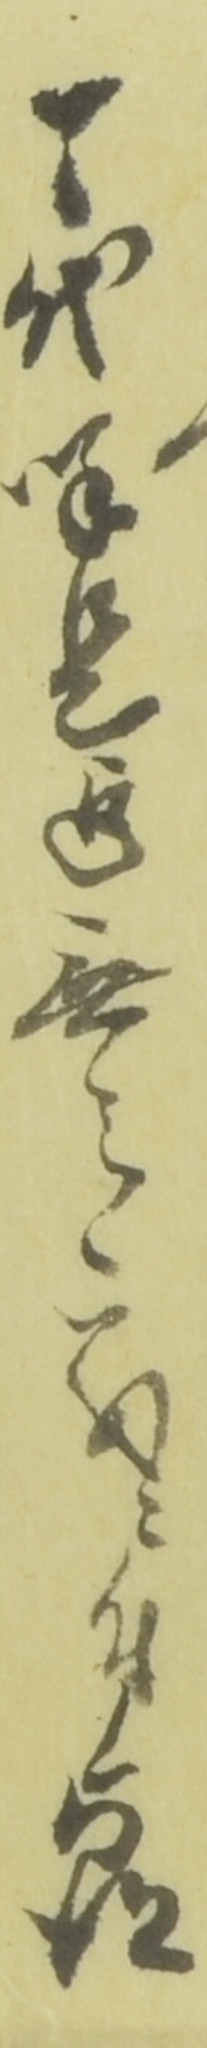丁代呼是迄無之候義ニ付与得
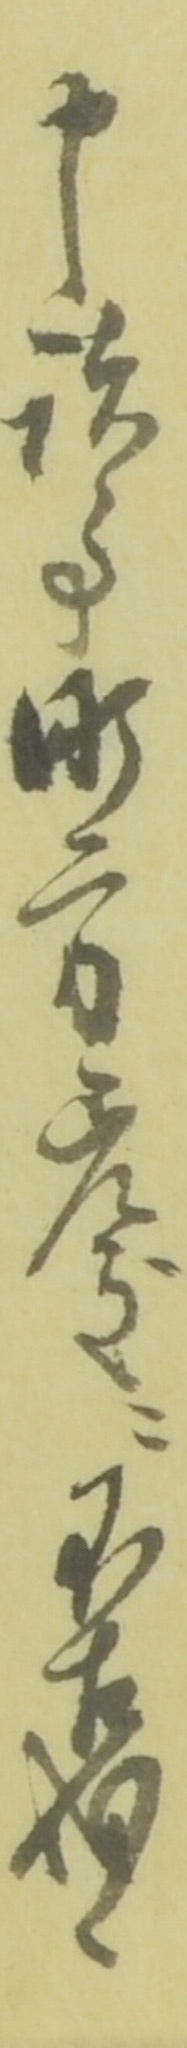申諸事町方差支ニ不相成候
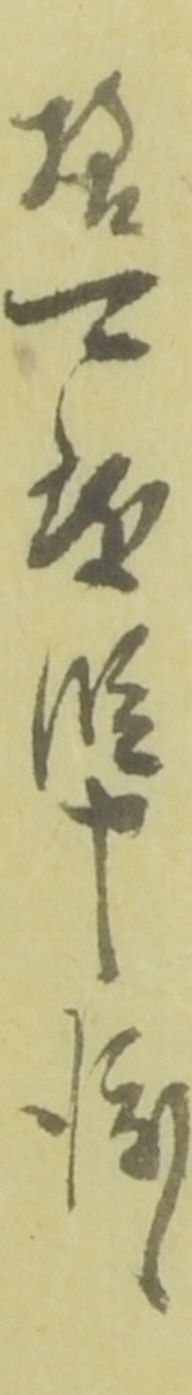様可致段申渡候
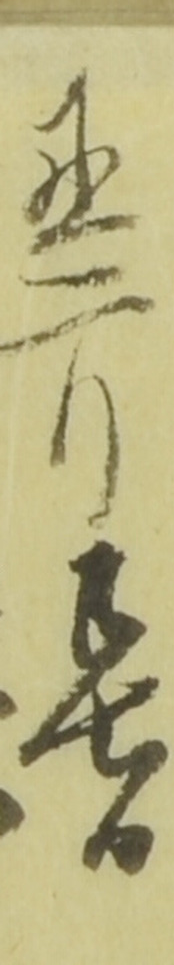丑二月廿七日
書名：御触書御書附控
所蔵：伊那市立高遠町図書館・合同会社AMANE
